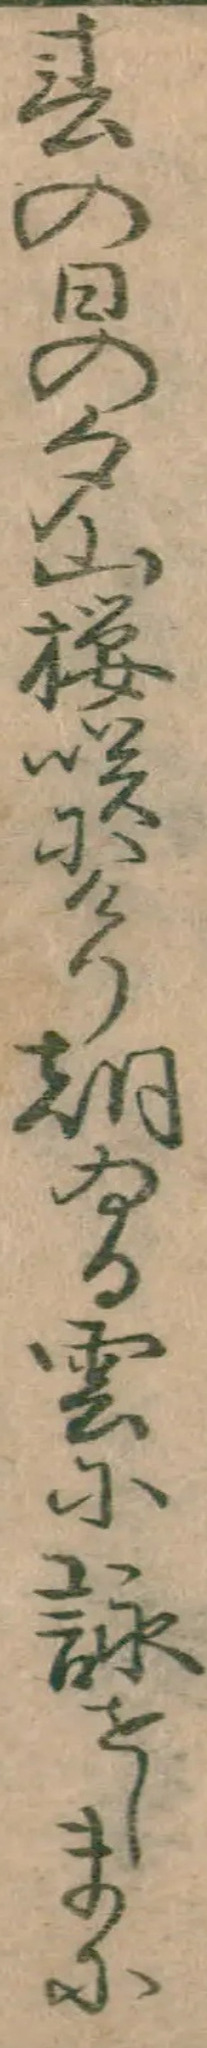春の日の夕山桜咲にけり朝ゐる雲に詠せしまに
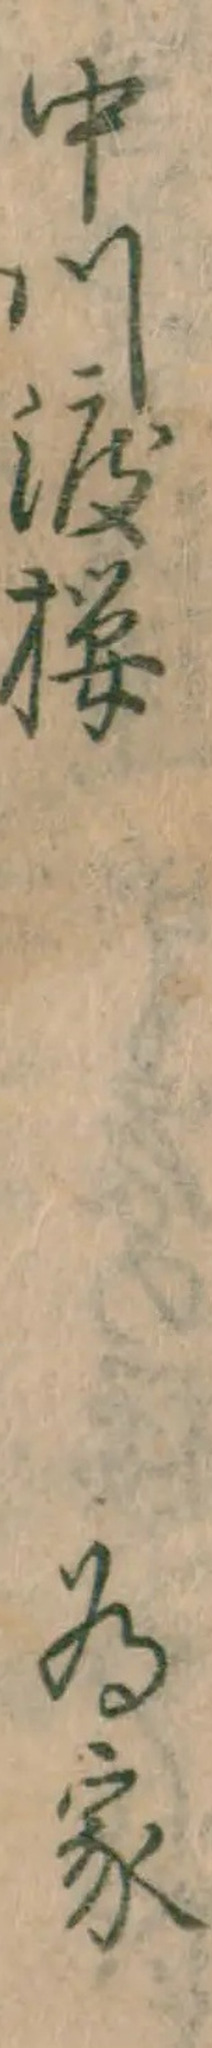中川渡桜為家
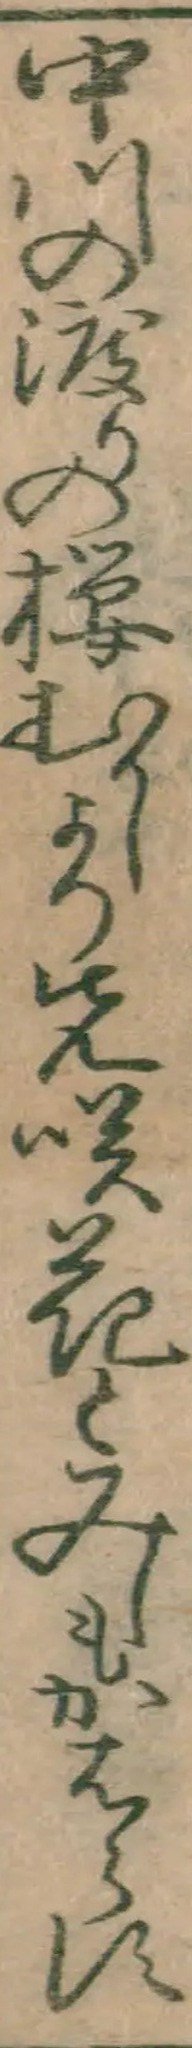中川の渡りの桜むかしより先咲花とみしもかはらす

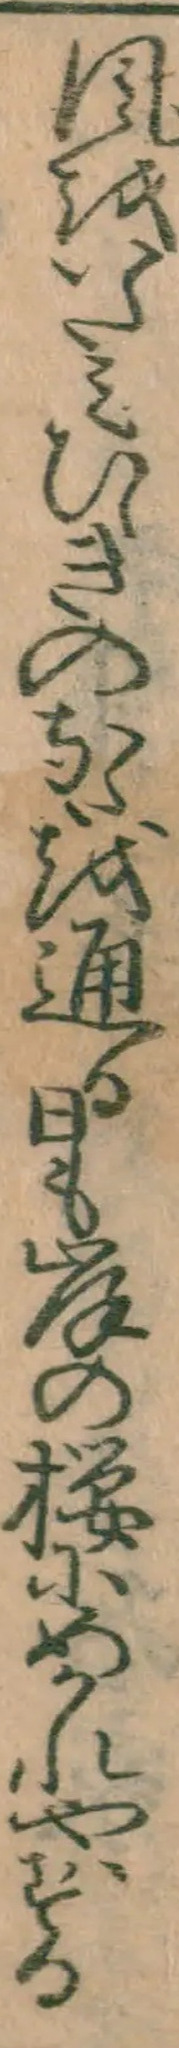風をいたみひゝきのなたを通る日も岸の桜にめかれやはする
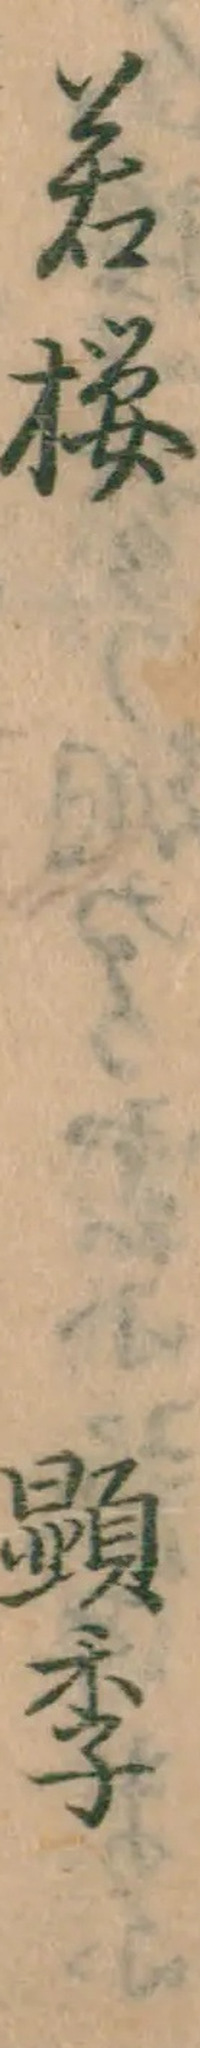若桜顕季
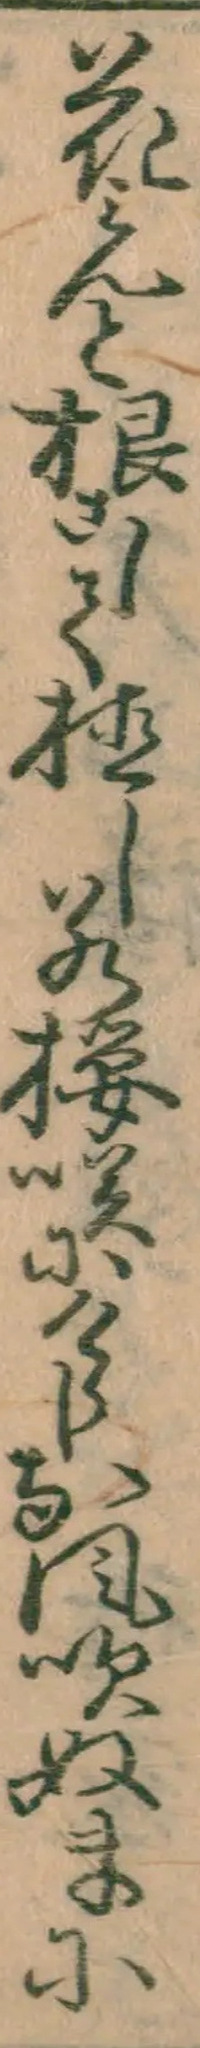花みんと根こして植し若桜咲にけらしな風吹ぬまに
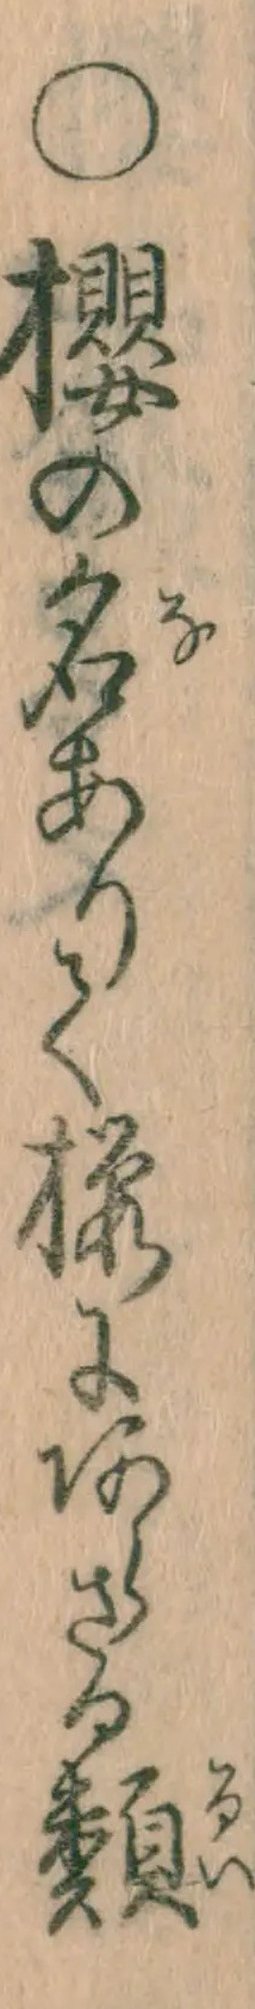○桜の名ありて桜にあらさる類
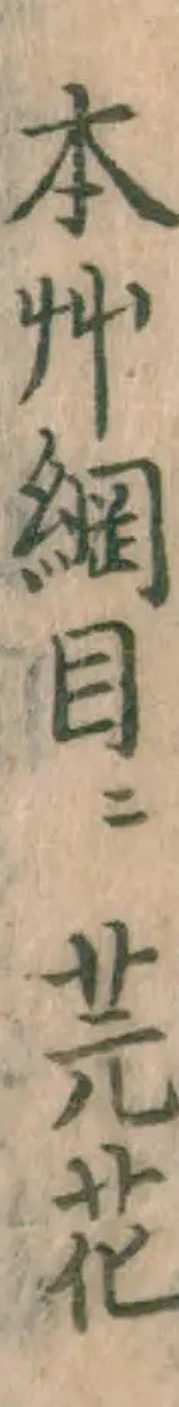本草綱目に芫花
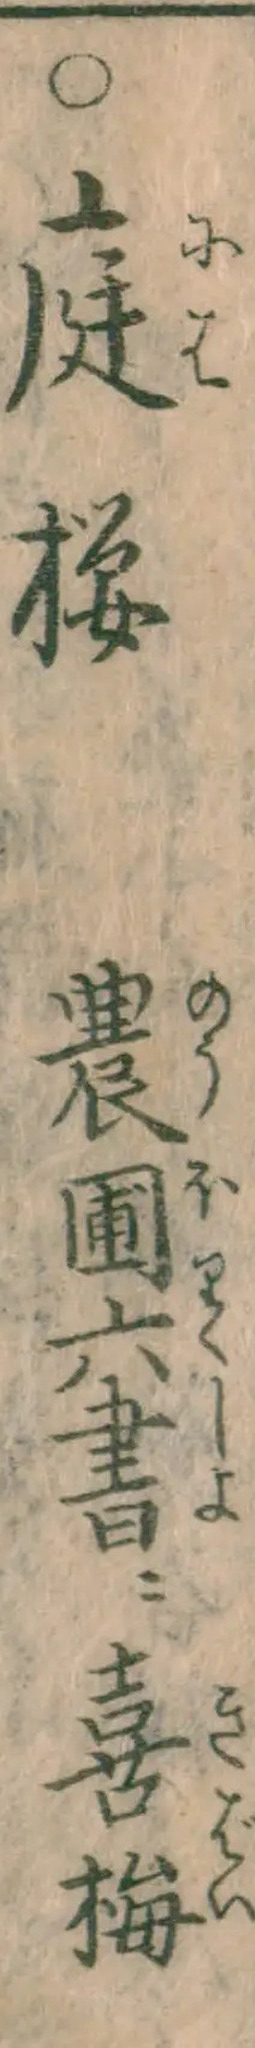○庭桜農圃六書に喜梅

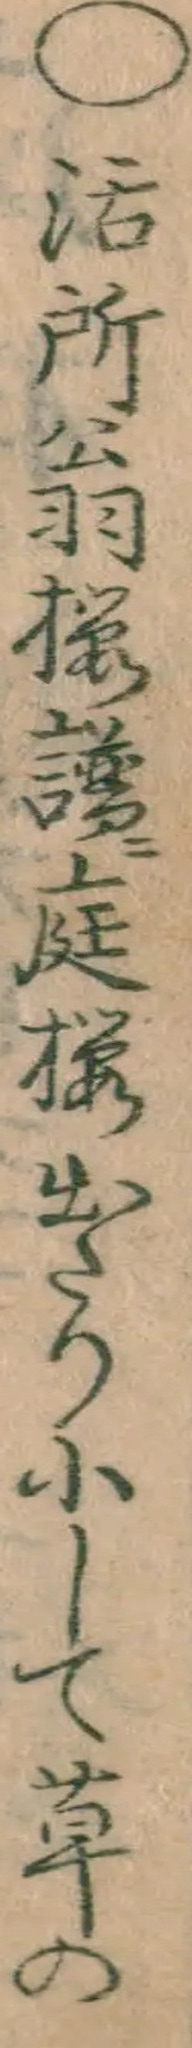○活所翁桜譜に庭桜出たりにして草の
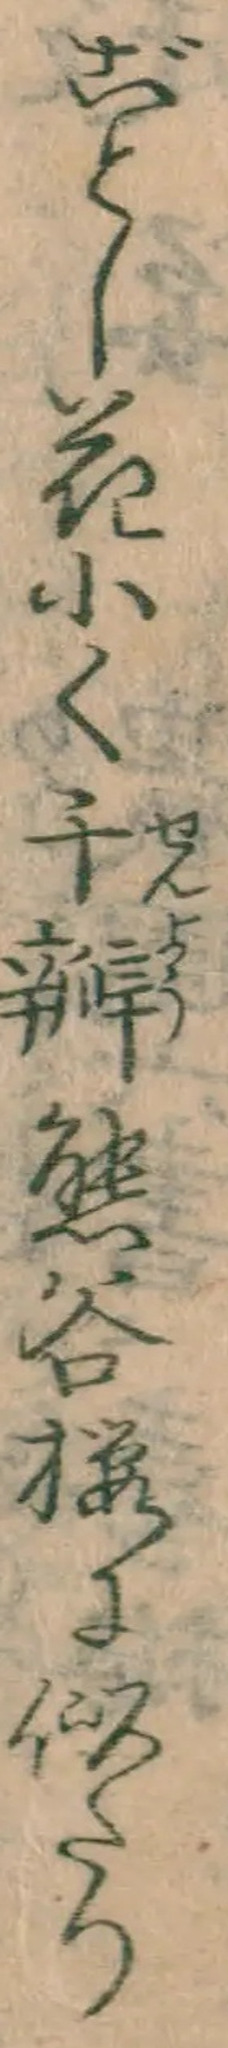ごとし花小く千弁熊谷桜に似たり
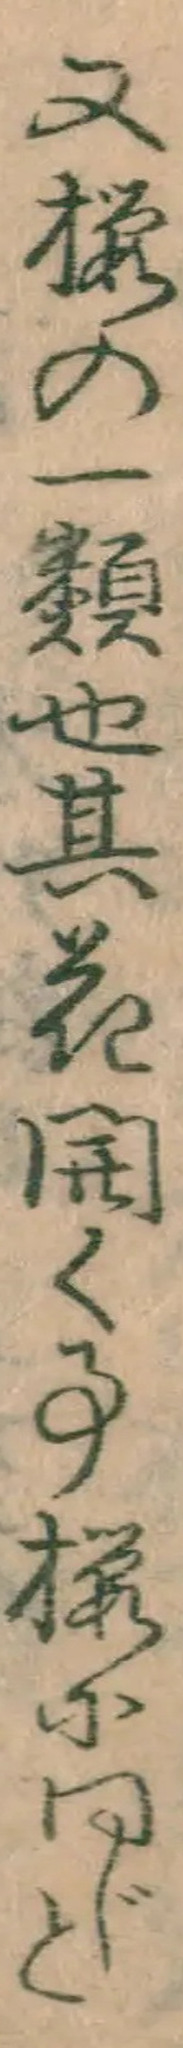又桜の一種也其花開く事桜に同じと
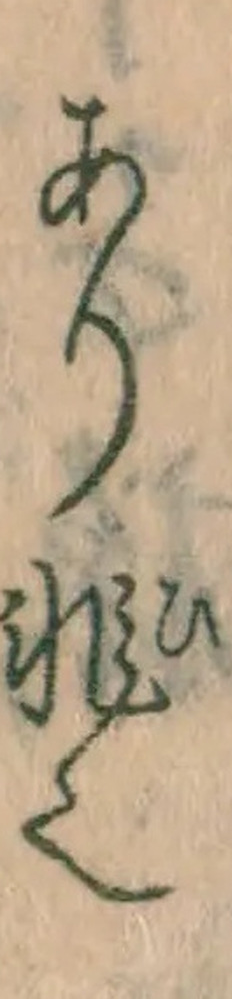あり非也
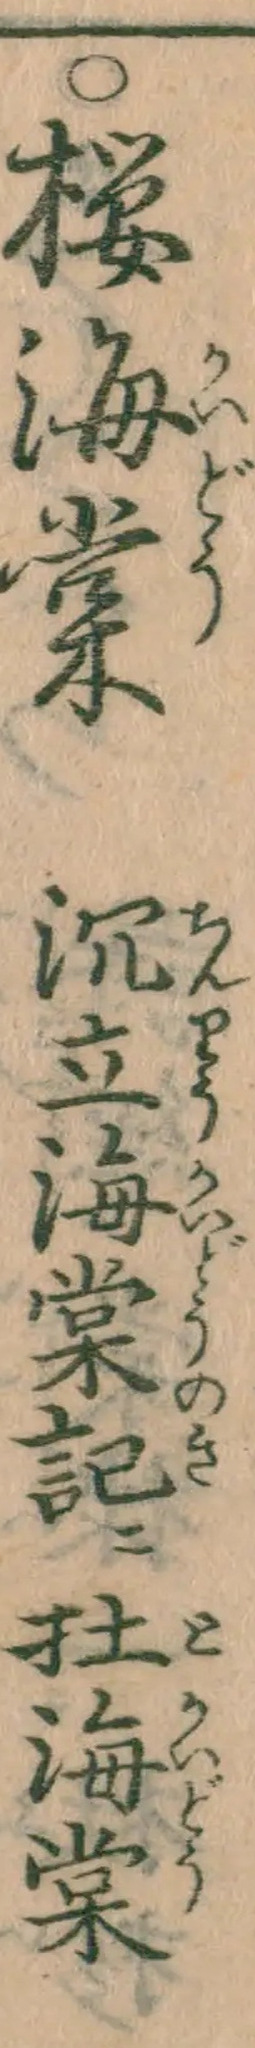○桜海棠沉立海棠記に杜海棠
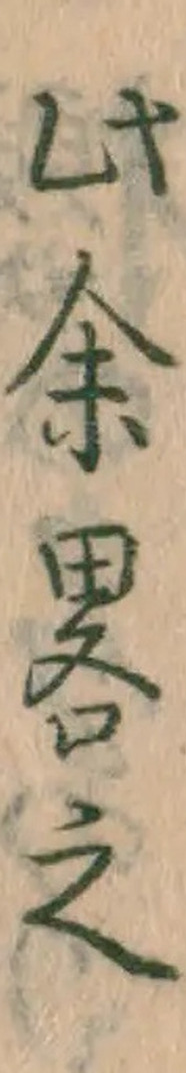此余略之
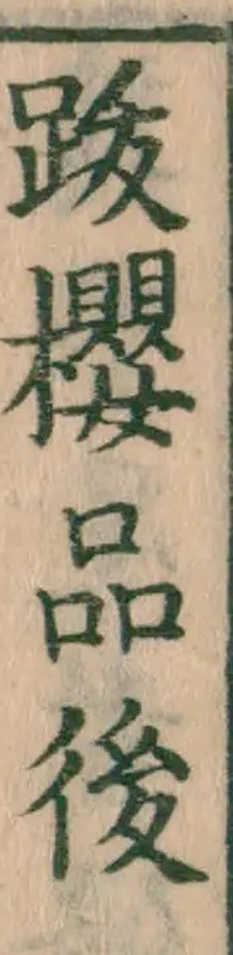跋桜品後
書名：怡顔齋櫻品
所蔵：国立国会図書館 National Diet Library, JAPAN
